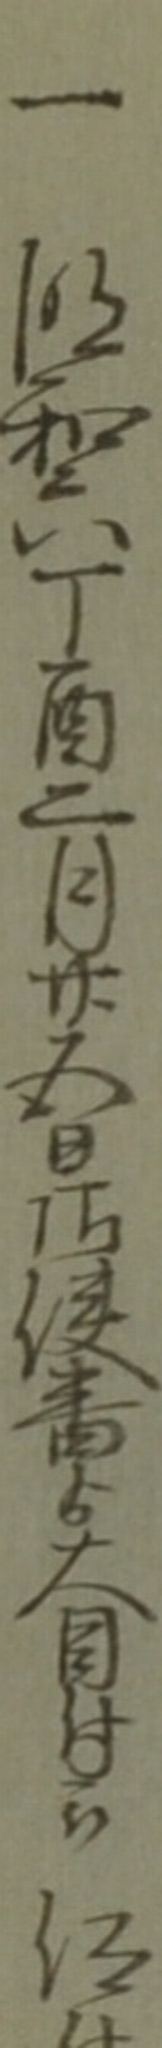一明和六丁酉二月廿五日御使番ゟ大目付被仰付
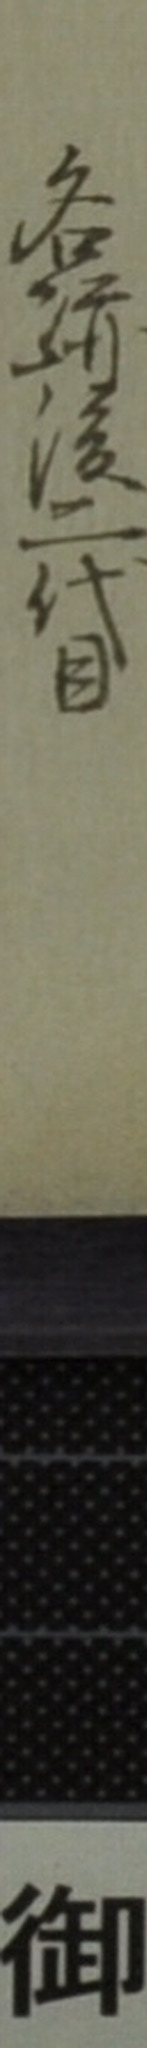名跡後二代目
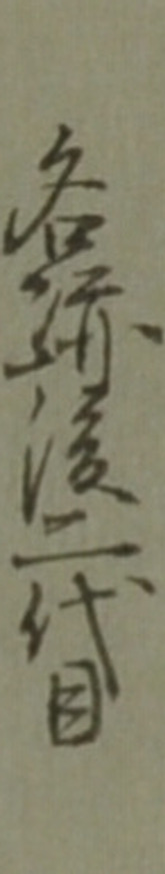名跡後二代目
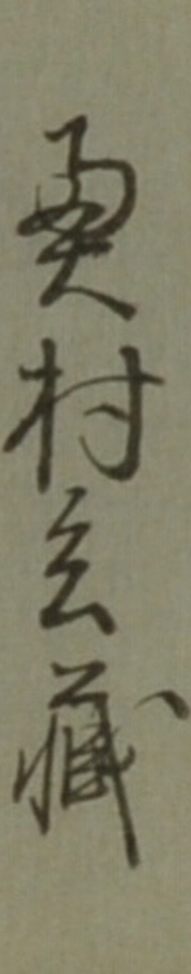奥村兵蔵
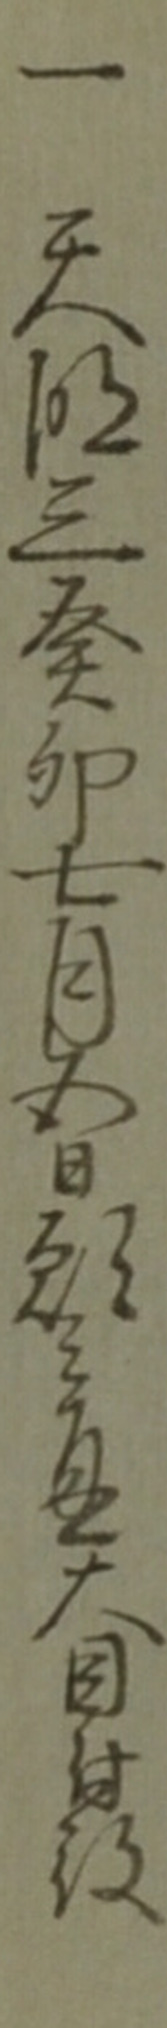一天明三癸卯七月五日願之通大目付役
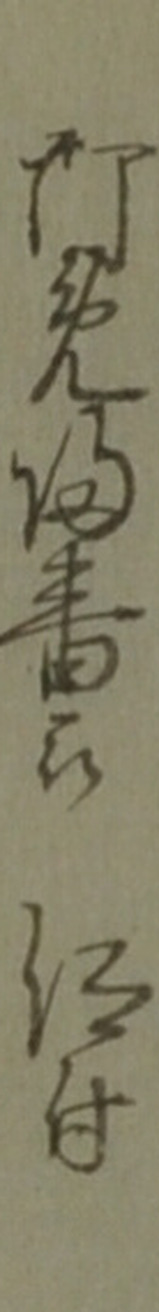御免帰番被仰付
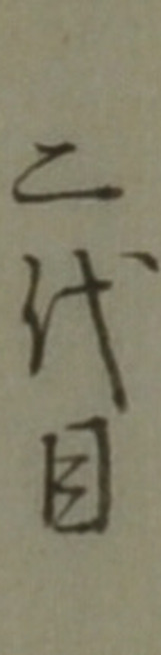二代目
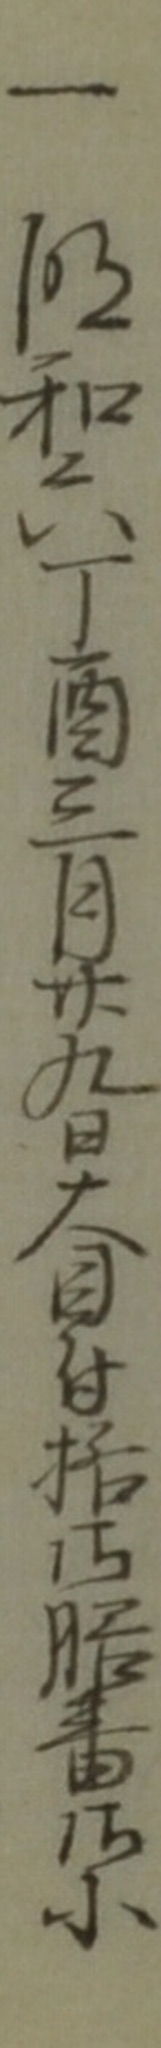一明和六丁酉三月廿九日大目付格御膳番御小
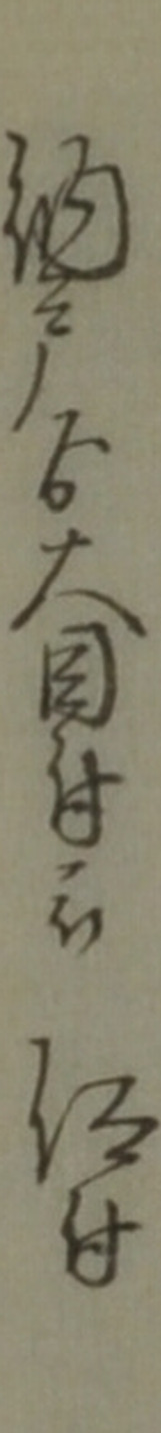納戸ゟ大目付被仰付
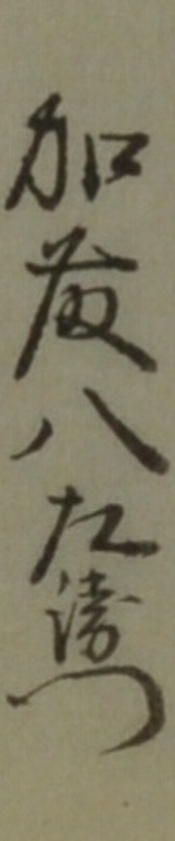加藤八左衛門
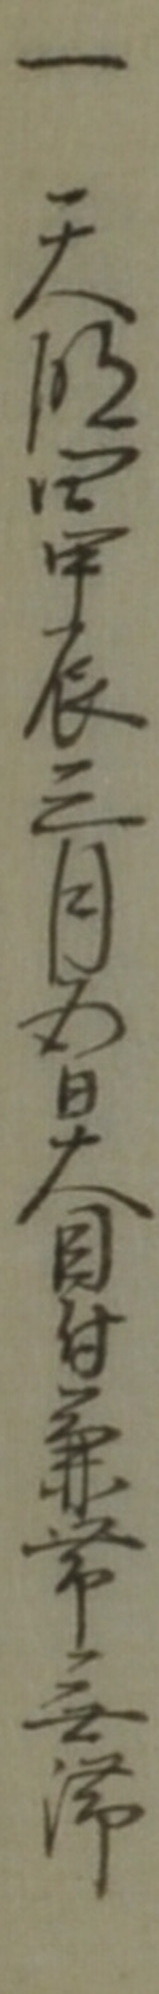一天明四甲辰三月五日大目付兼帯無滞
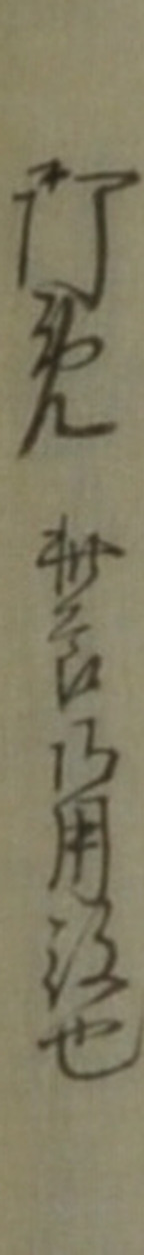御免此節御用役也
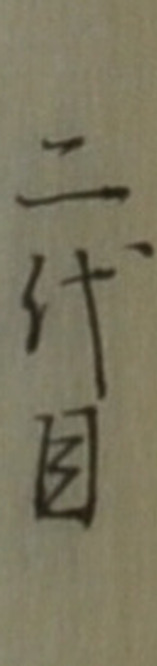二代目
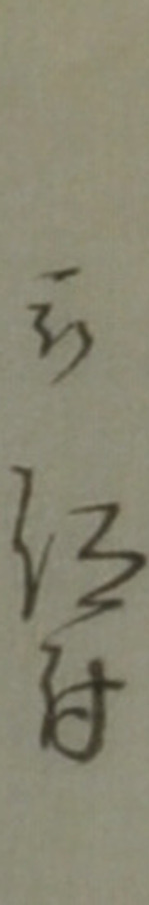被仰付
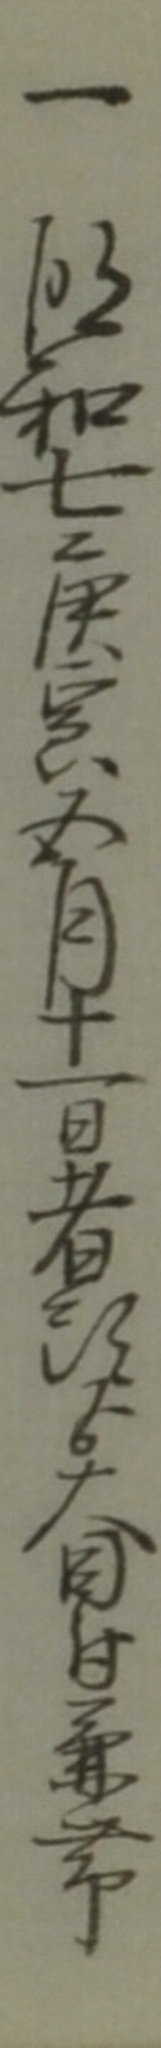一明和七庚寅五月十一日者頭ゟ大目付兼帯
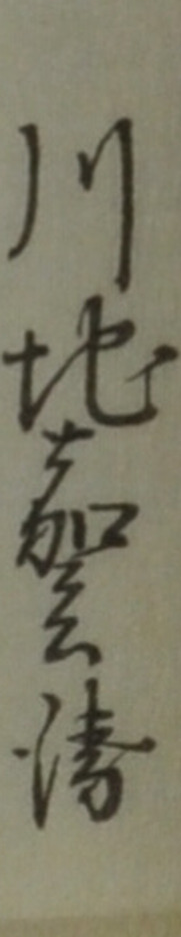川地喜兵衛
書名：諸御役代々録（三）
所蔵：伊那市立高遠町図書館・合同会社AMANE
